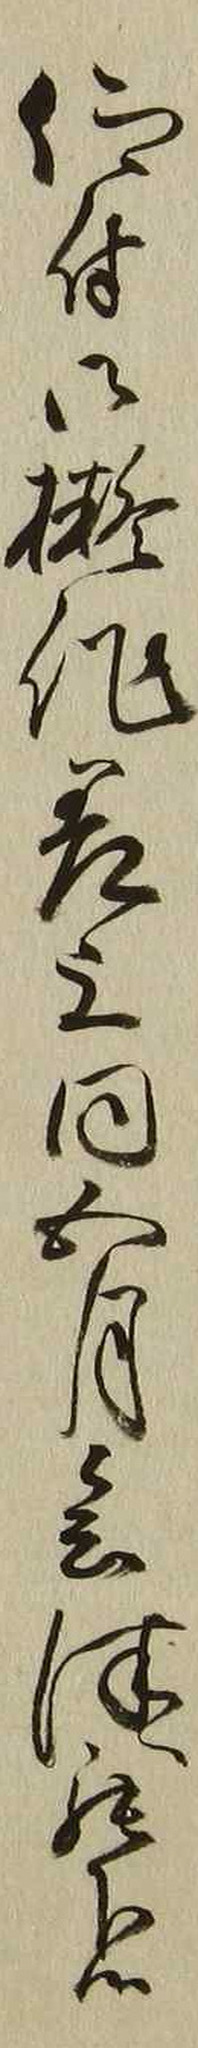仰付御擬作差上同五月会津へ罷下候
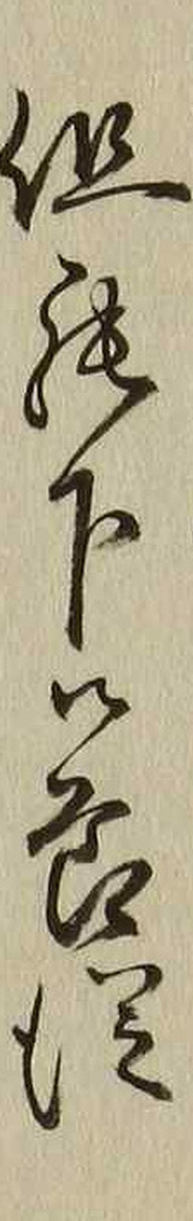但罷下候節従
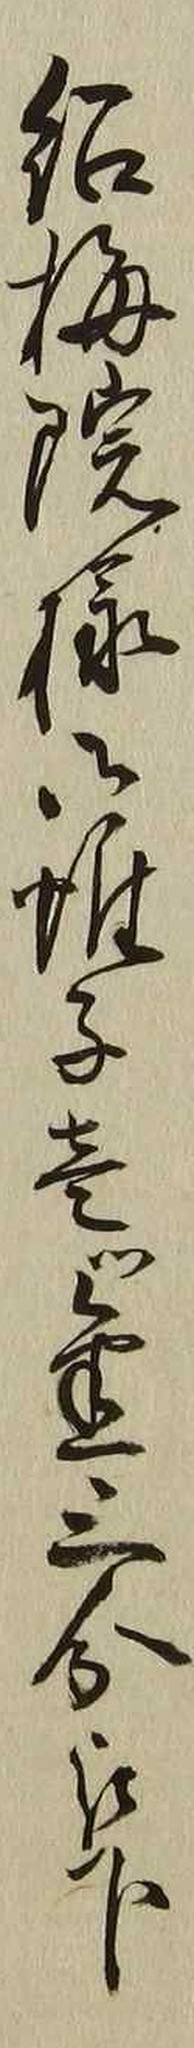紹栴院様御帷子壱ツ金三分被下
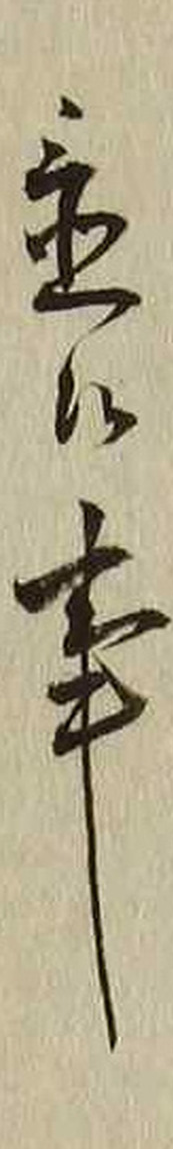置候事
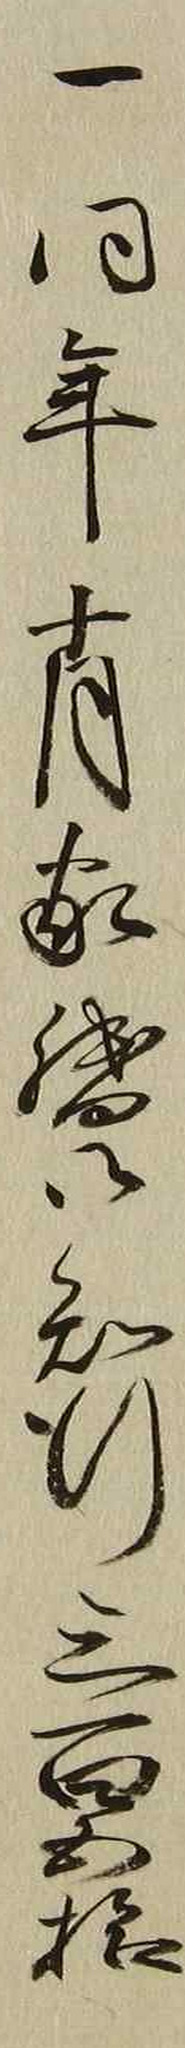一同年十月家督御知行三百五拾
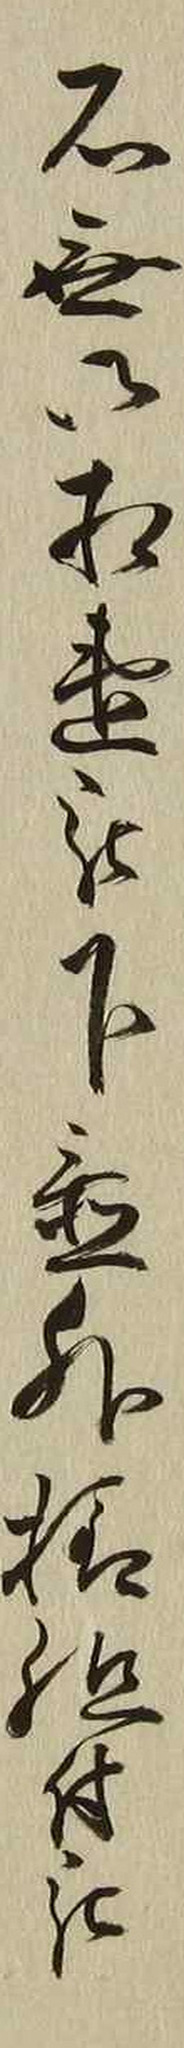石無御相違被下置外様組付被
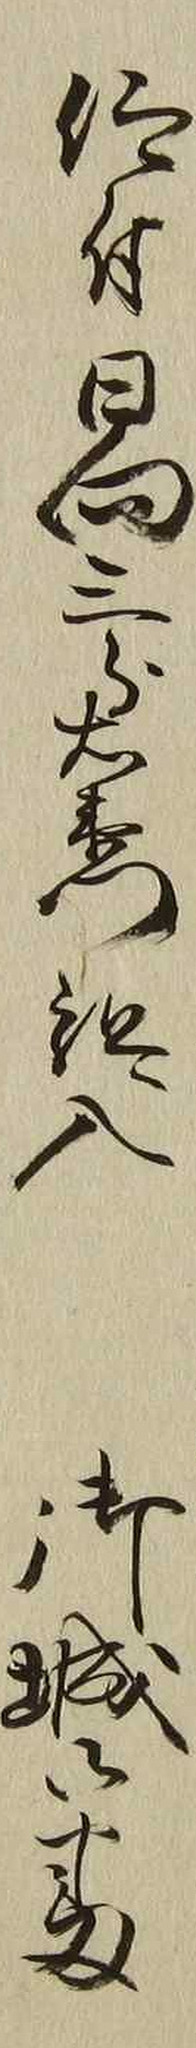仰付日向三郎右衛門組へ入御城御番
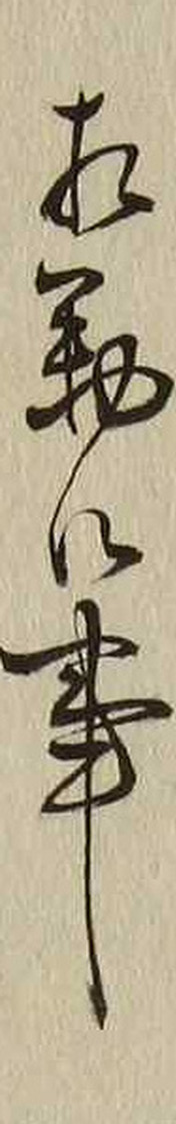相勤候事
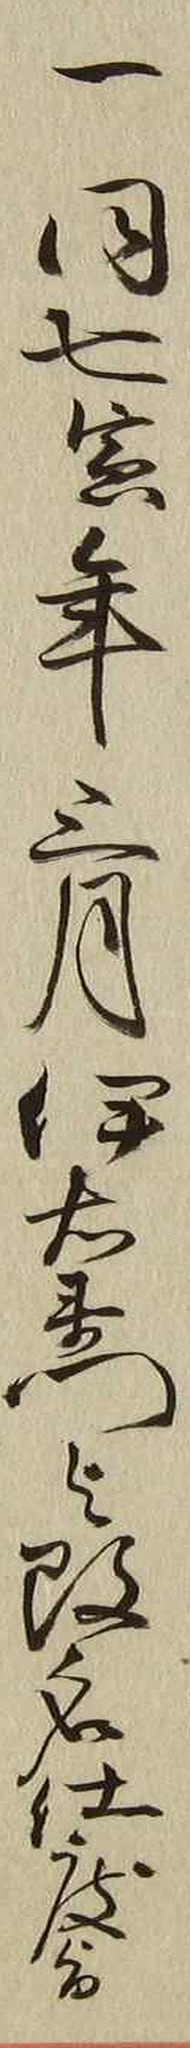一同七寅年三月伊右衛門与改名仕度旨
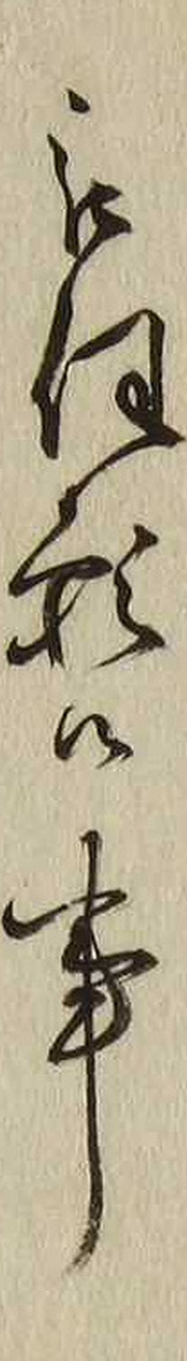被任願候事
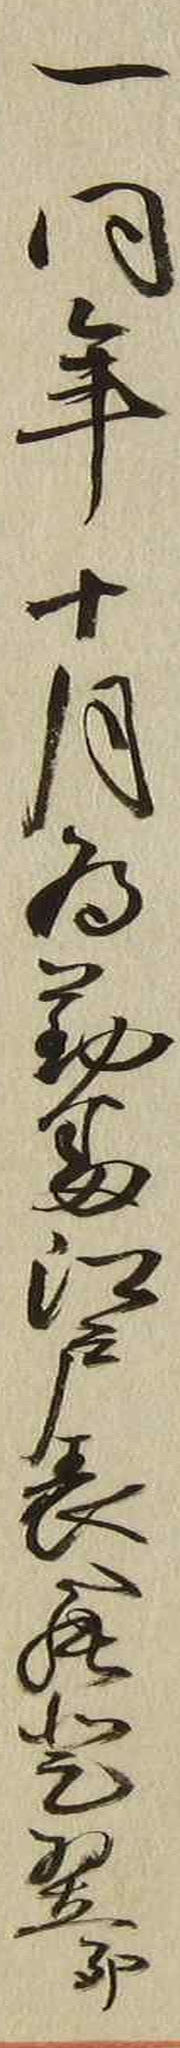一同年十月為勤番江戸表へ罷登翌卯
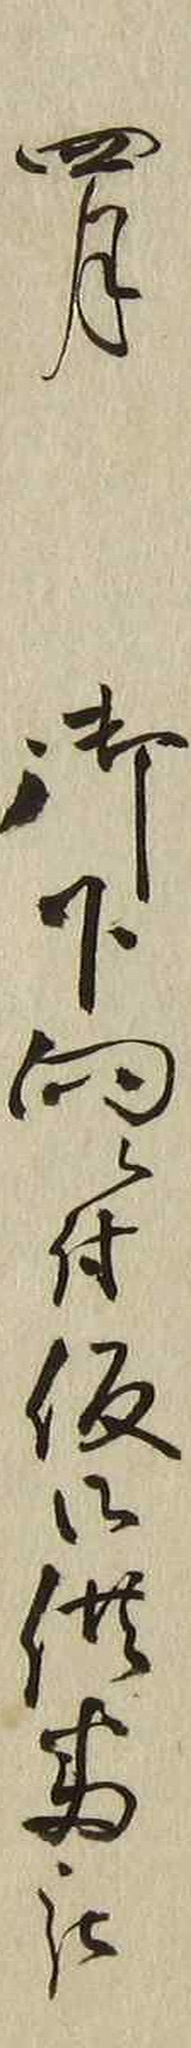四月御下向ニ付仮御供番被
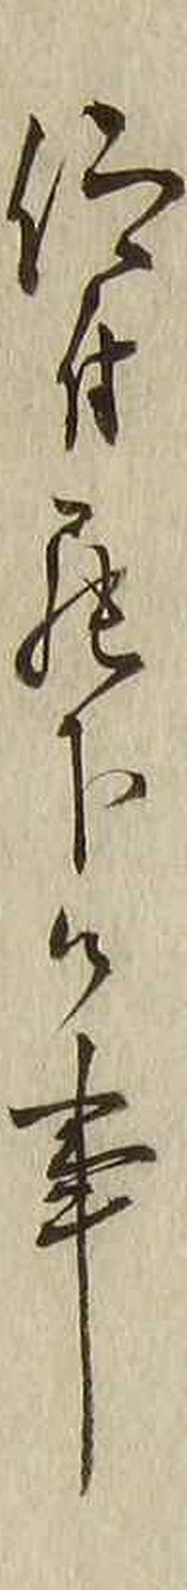仰付罷下候事
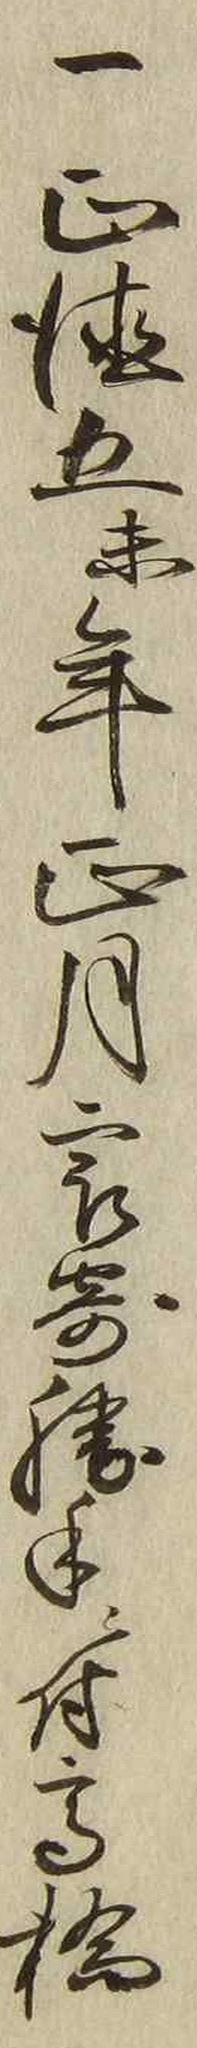一正徳五未年正月最寄勝手ニ付高橋
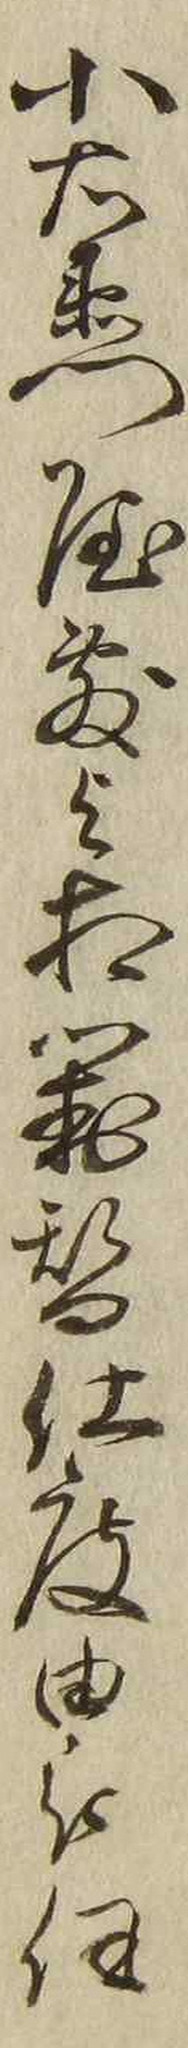小右衛門屋敷与相対替仕度由被任

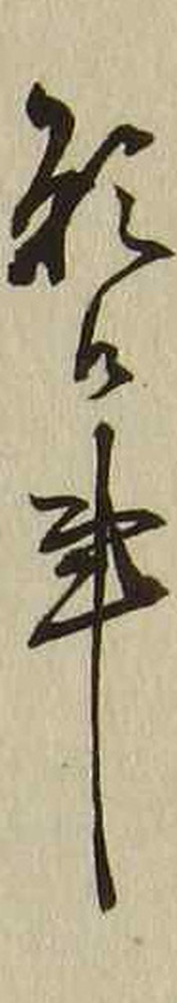願候事
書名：諸士系譜　巻之60　と之部3
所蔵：会津若松市立会津図書館
